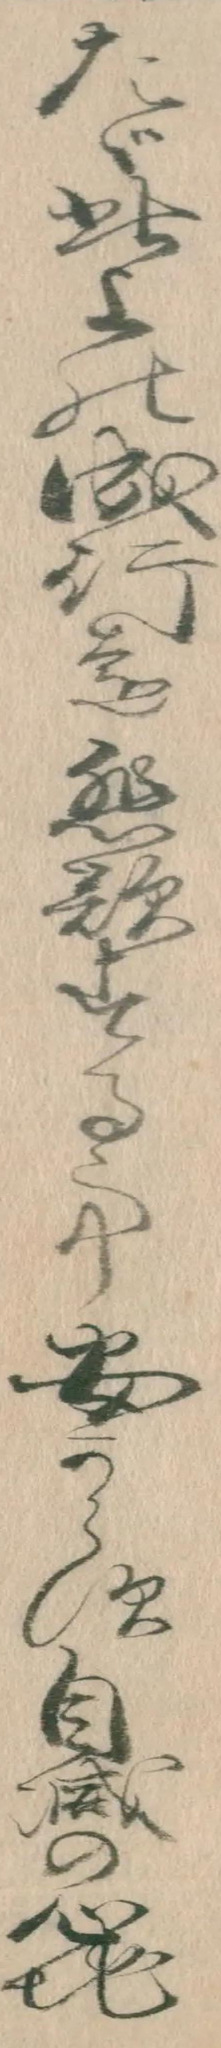たゞ此上の成行を悲歎する事安からす自滅の心地
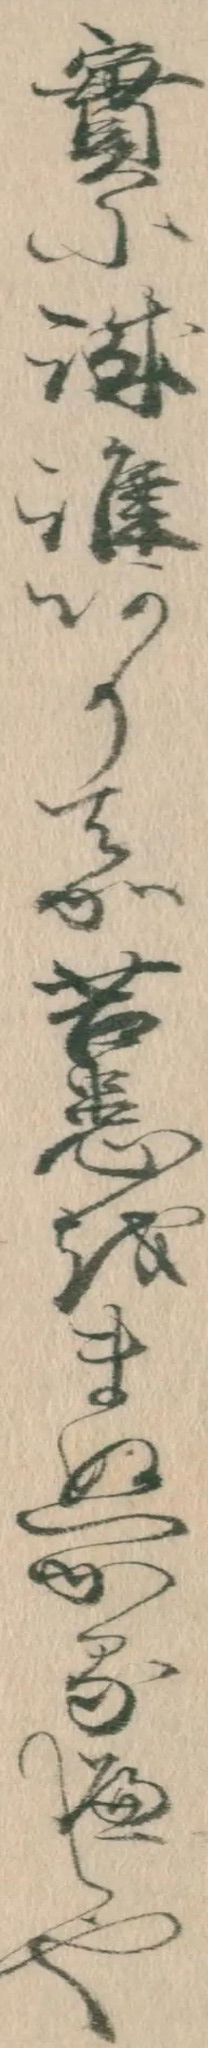実に誠誰ありてか苦患をまぬかるへしや
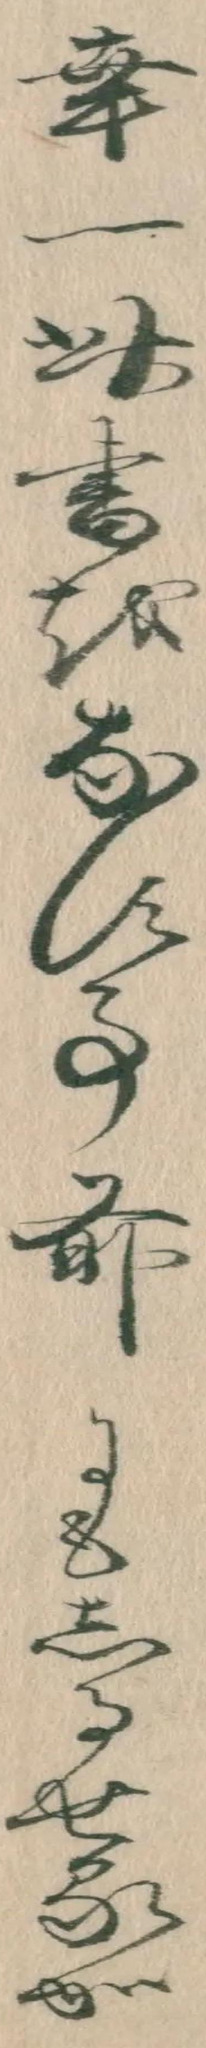幸一此書をなす事前にもしるせるか
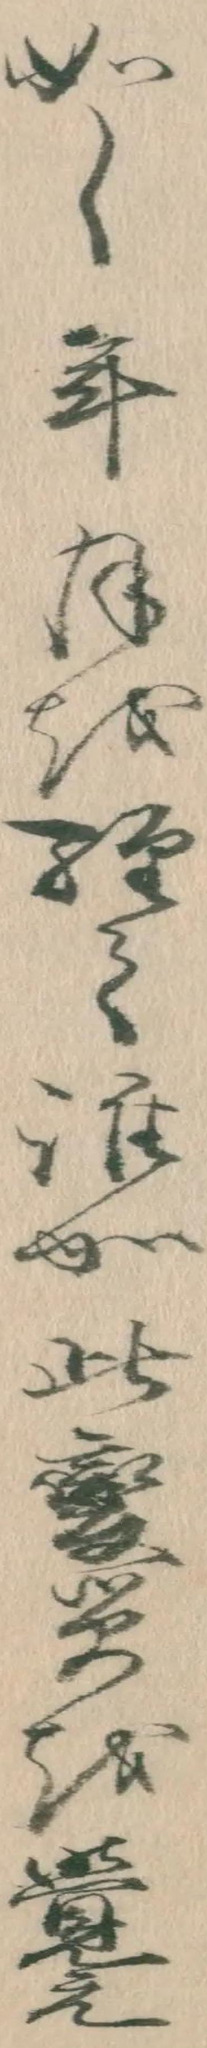如く年月を経て誰か此変災を覚え
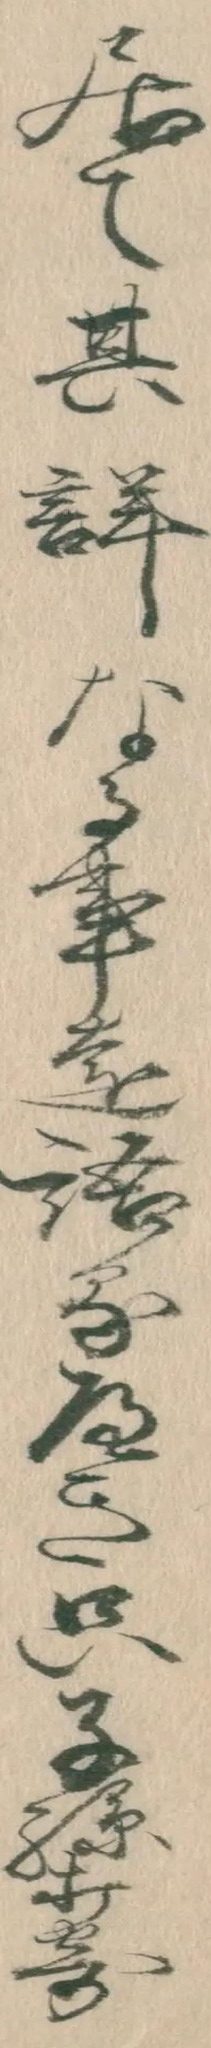居て其詳なる事を語るへき只子孫打寄
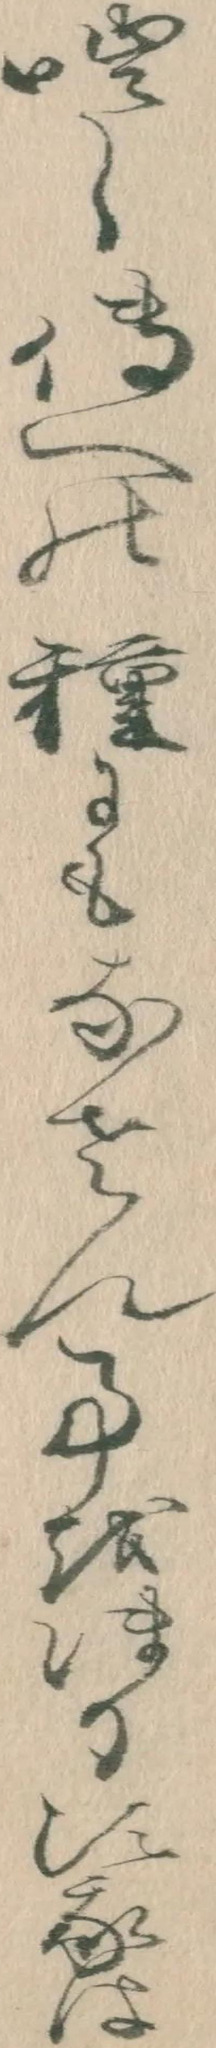咄し伝への種にもなさん事をほ？りす我は
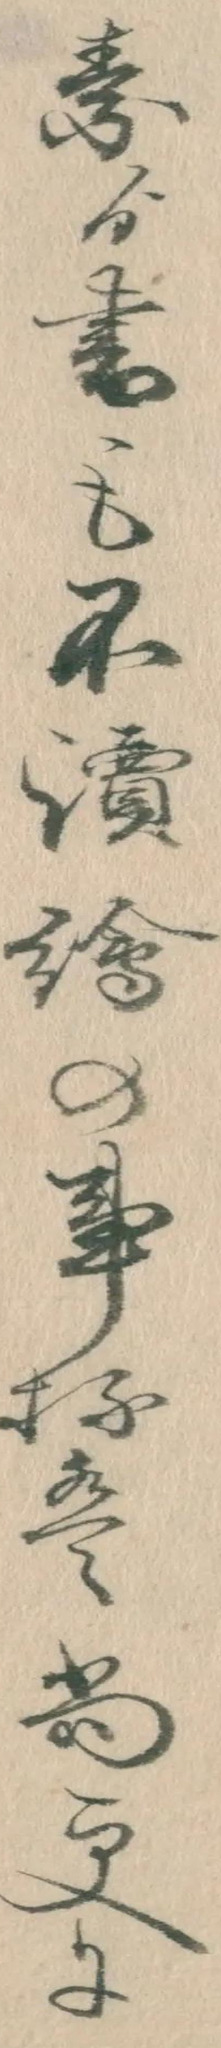素ゟ書も不読絵の事抔は尚更に
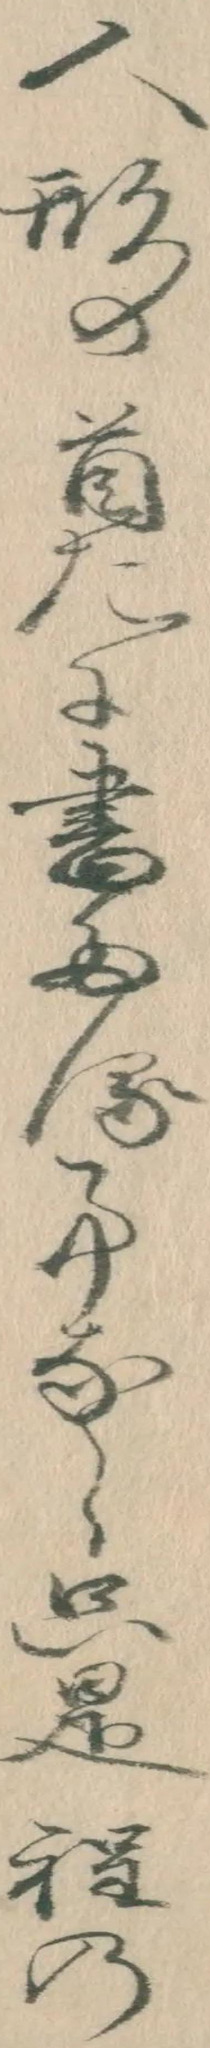人形の首たに書たる事なし只是程の

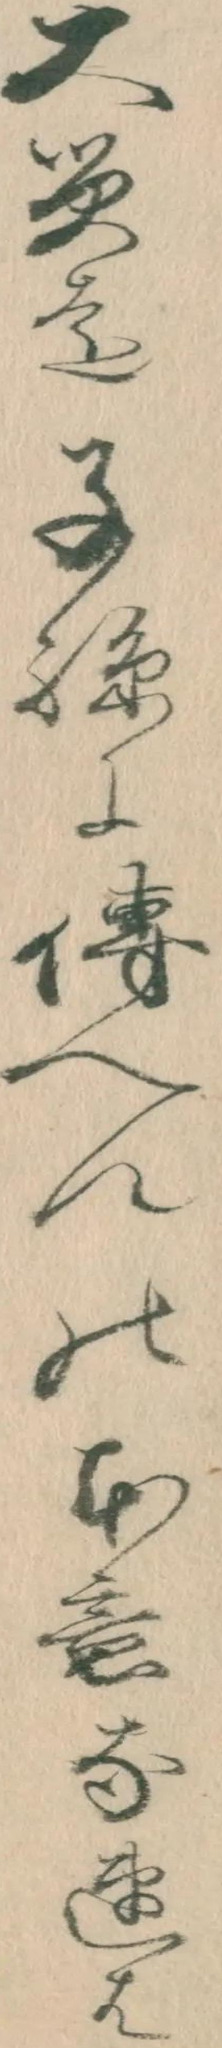大災を子孫に伝へんの本意なれは
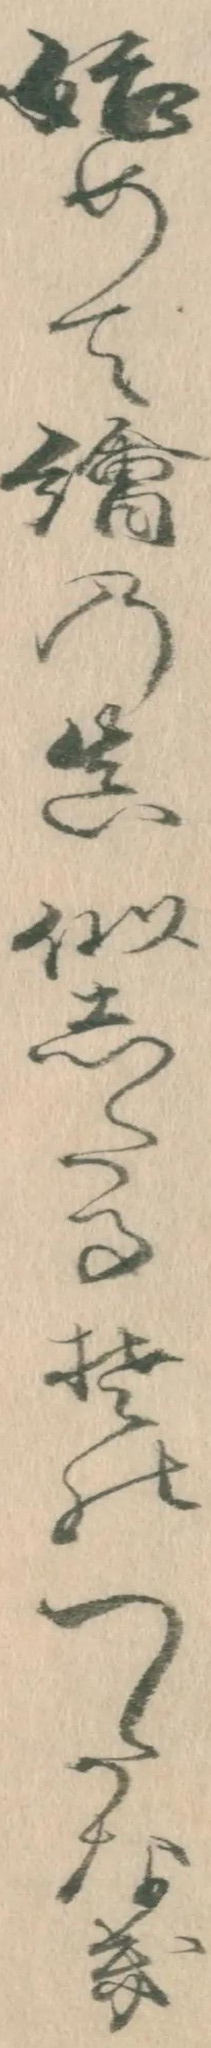始めて絵の真似したるそのつたなき
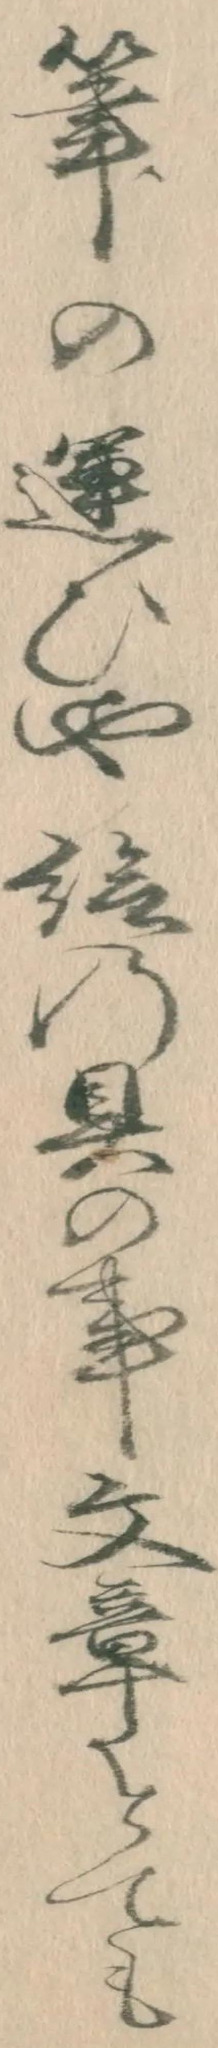筆の運ひや絵の具の事文章とても
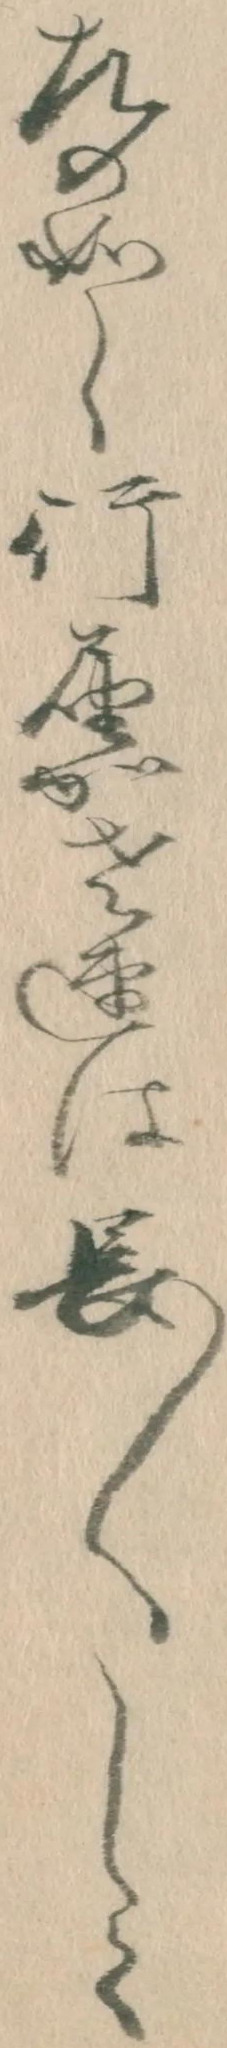左の如く行届かされは長〳〵しく
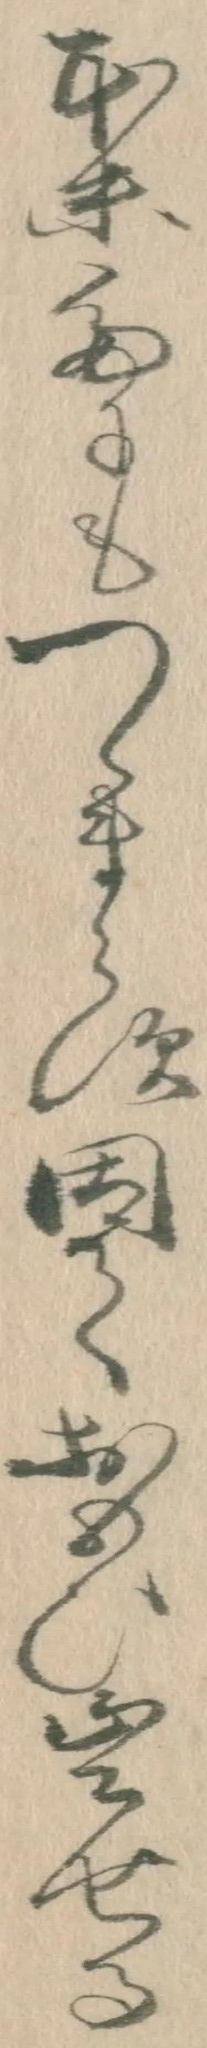本末たにもつゝまらす因ておもひ出せる
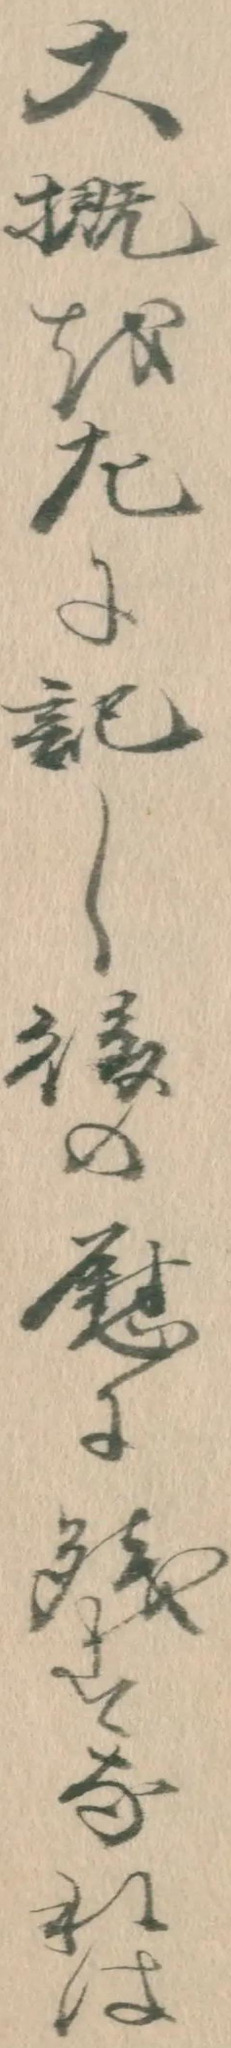大概を左に記し後の慰に残すなれは
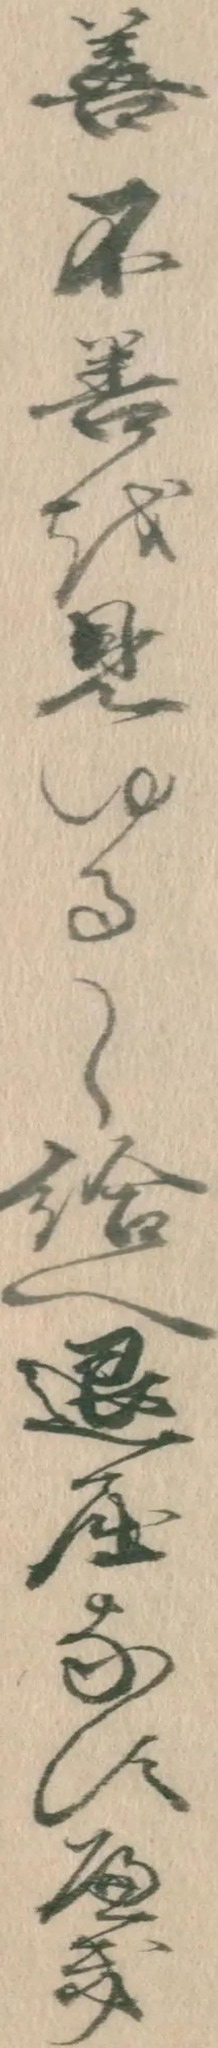善不善を見ゆるし給へ退屈なすへき
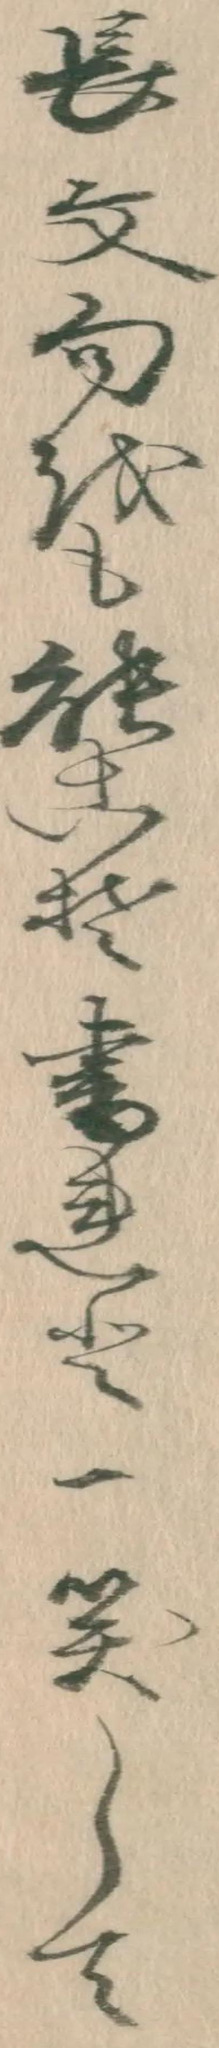長文句をも能こそ書れと一笑して
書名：俗語之種. [6]
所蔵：国立国会図書館 National Diet Library, JAPAN
